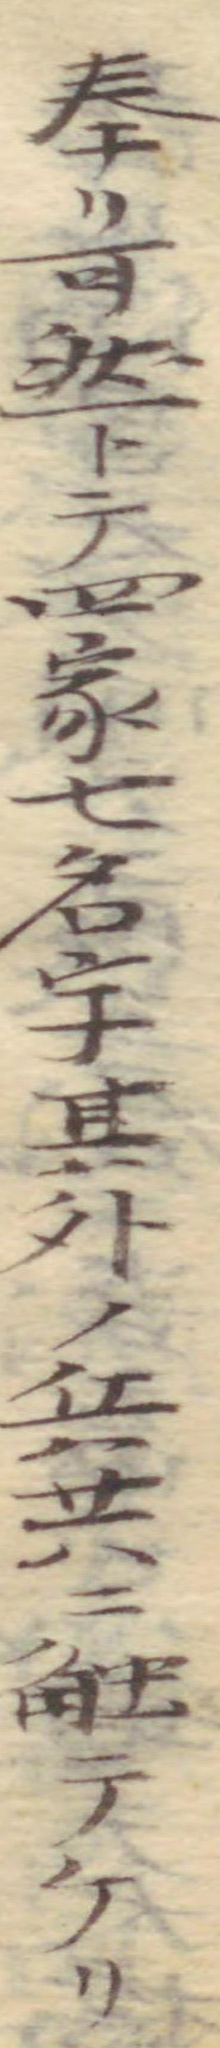奉リ可然トテ四家七名字其外ノ兵共ニ触テケリ
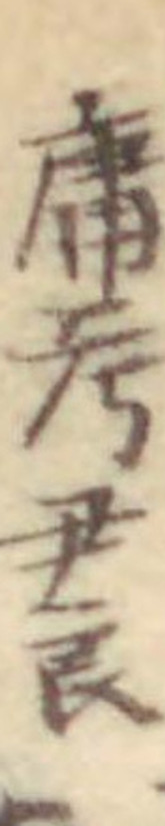庸考尹良
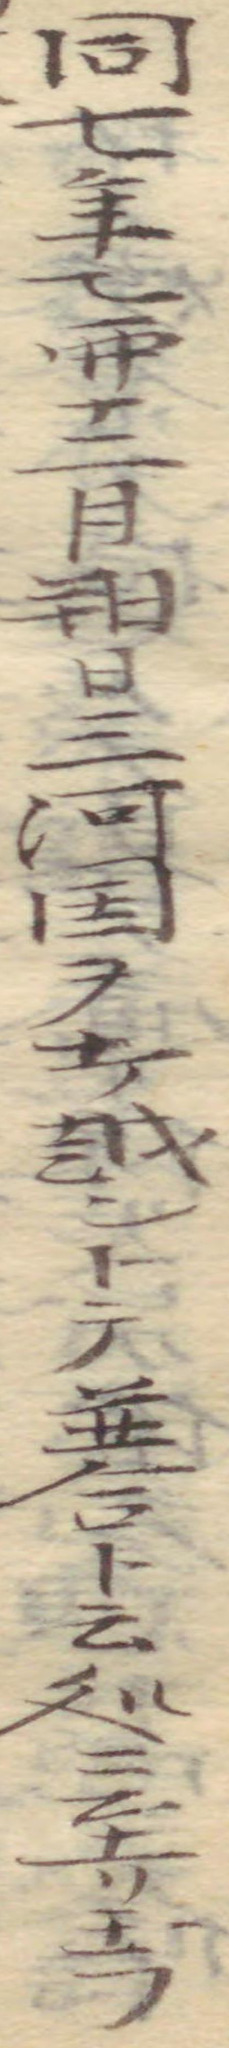同七年乙卯十二月朔日三河国ヲ打越ントテ並合ト云処ニ至リ玉フ
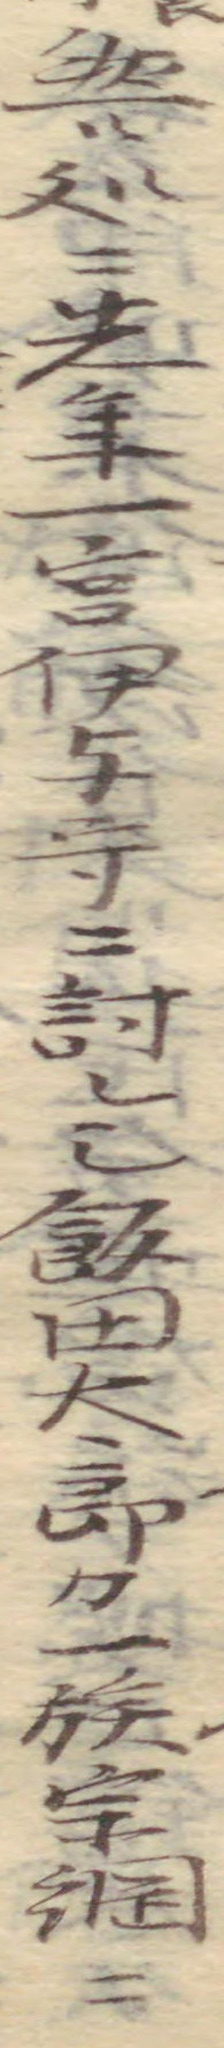然ル処に先年一宮伊予守ニ討レシ飯田太郎カ一族宗綱ニ
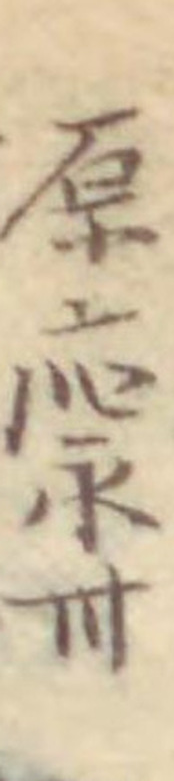原応永卅
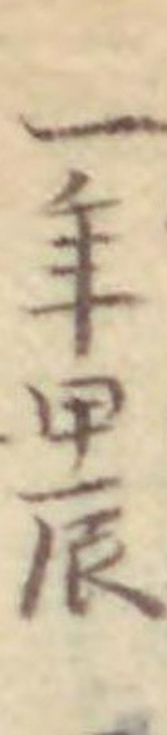一年甲辰
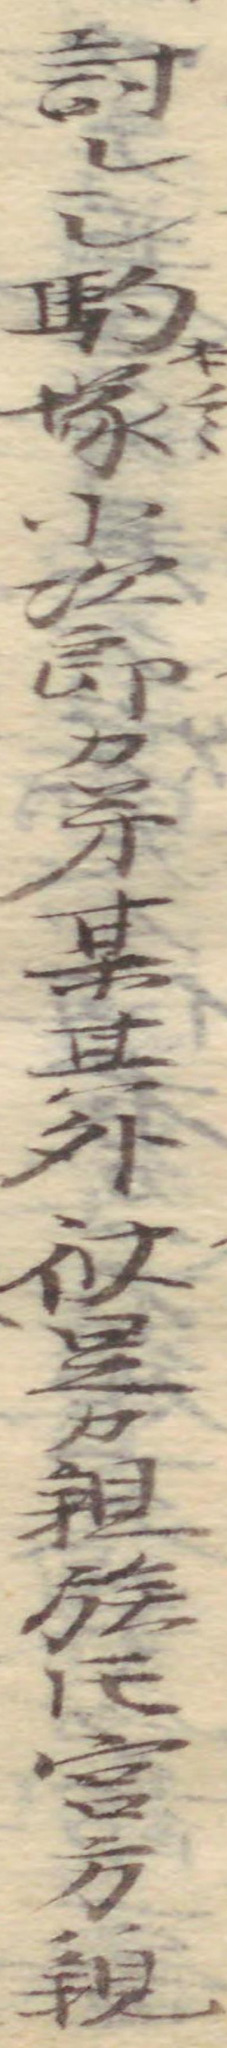討レシ駒塚小次郎カ弟某其外彼是カ親族トモ宮方ハ親
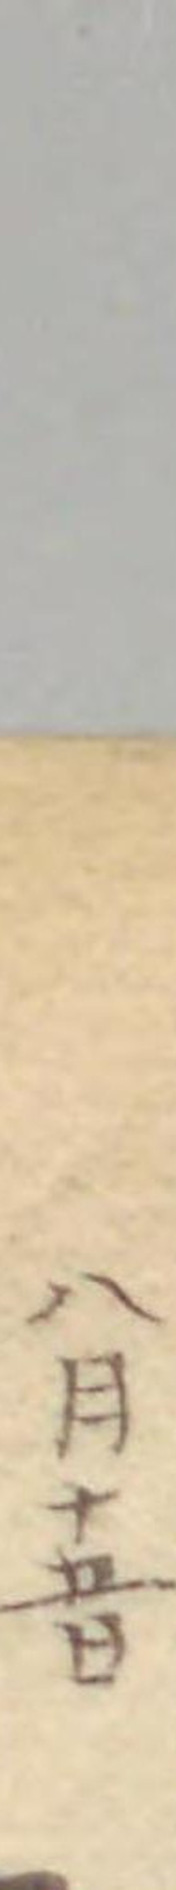八月十五日
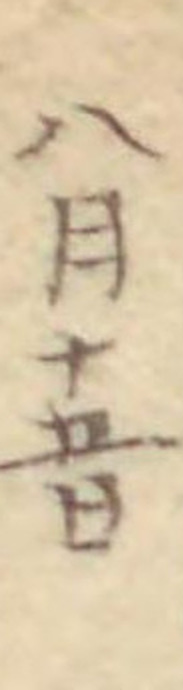八月十五日
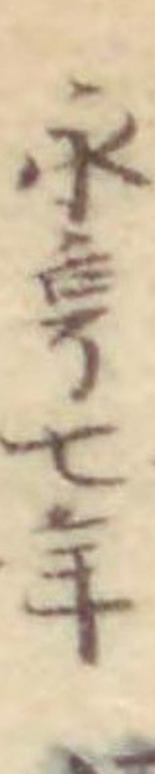永亨七年
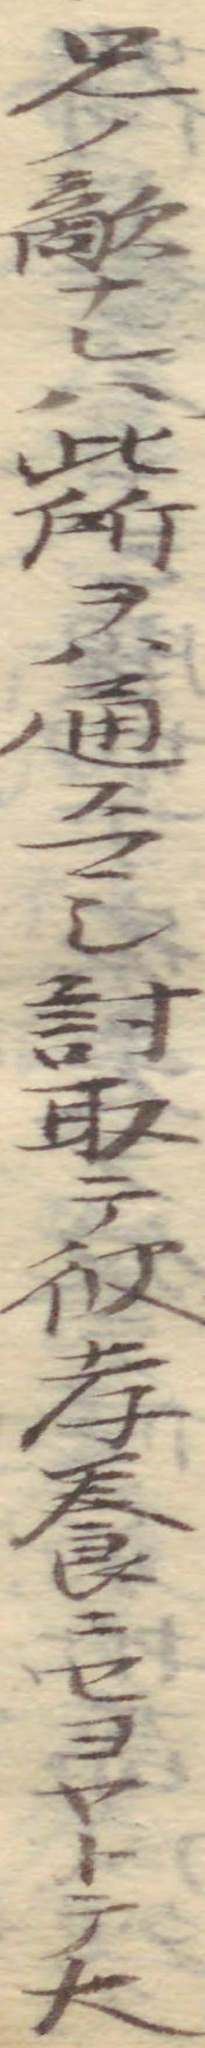兄ノ敵ナレハ此所ヲハ通スマシ討取テ彼孝養ニセヨヤトテ大
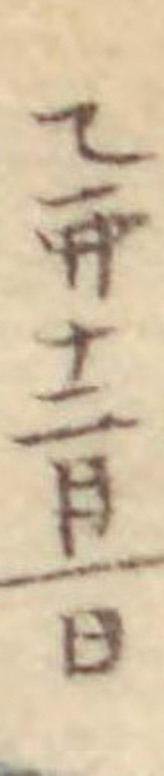乙卯十二月一日
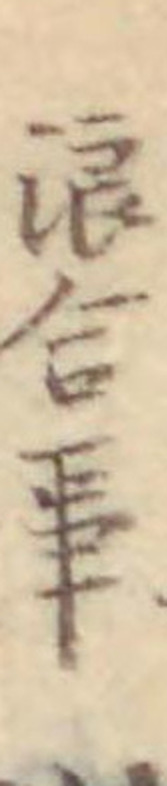浪合事
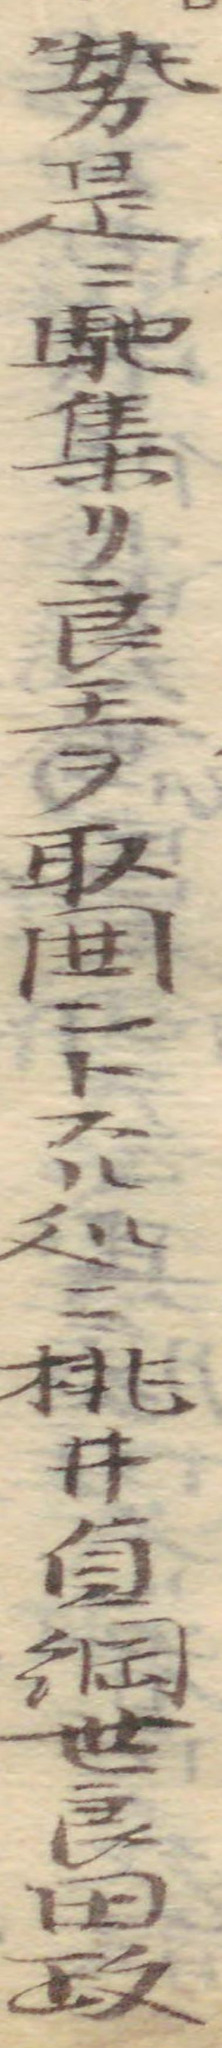勢是ニ馳集リ良王ヲ取囲ントスル処ニ桃井貞綱世良田政
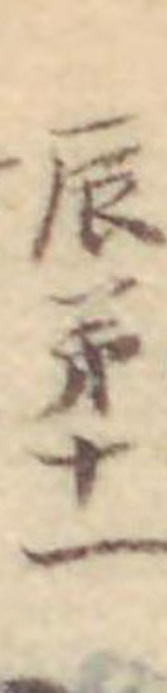辰第十一
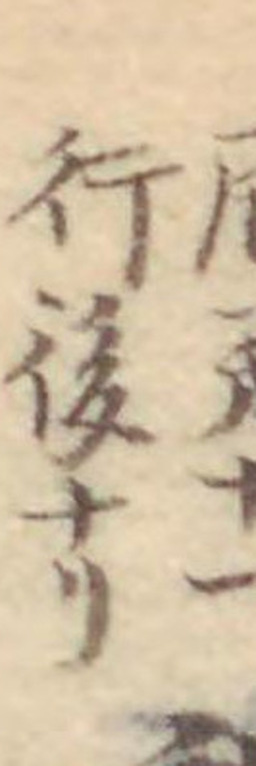行後ナリ
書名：鶯宿雑記. 巻199-200
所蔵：国立国会図書館 National Diet Library, JAPAN
